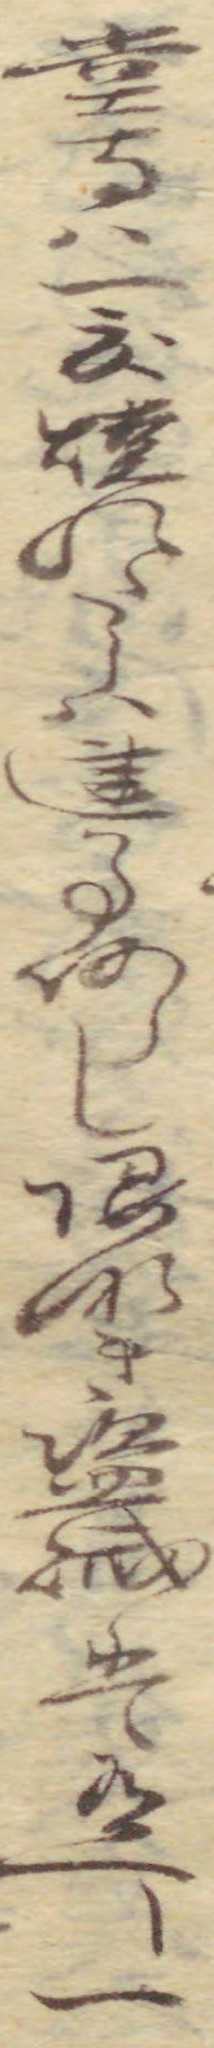堂寺は一度焼れたらは建事あらし限なき盗賊にて有へし一
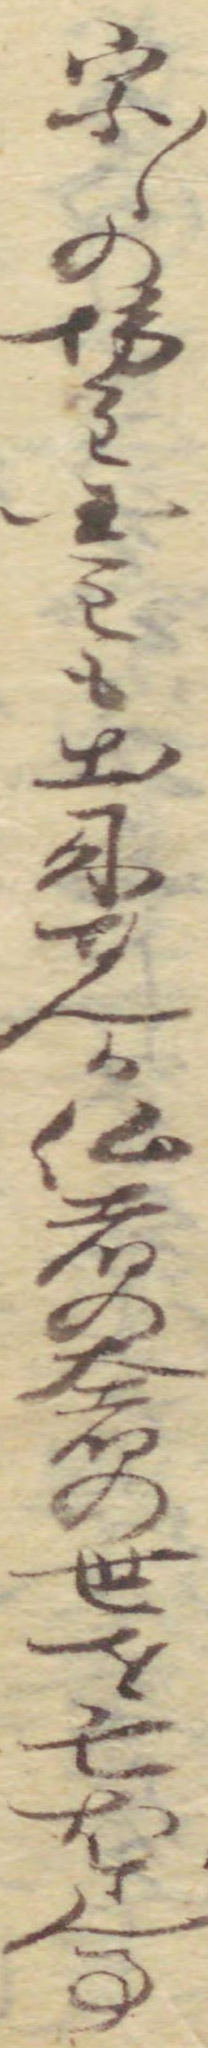宗〳〵の坊主国主も出来なんか仏者の奢の世を亡さん事
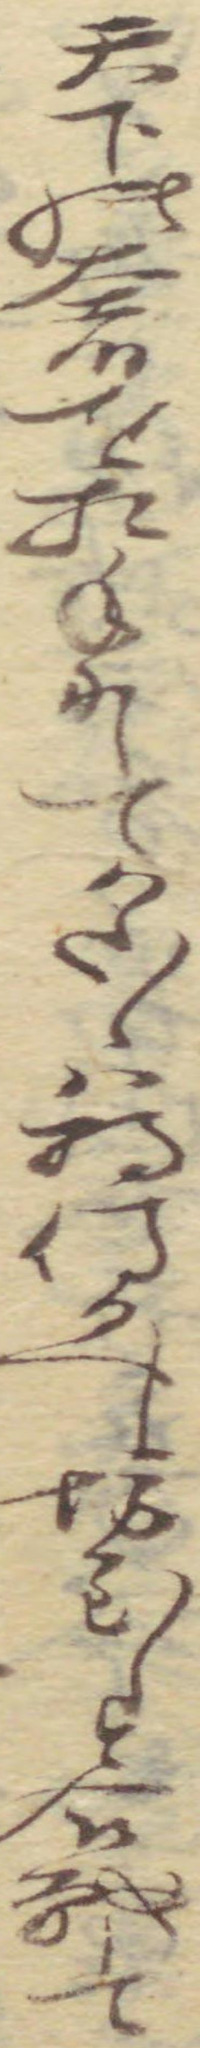天下の奢を相手にしてかた〳〵は持侍るへし坊主〳〵と合戦して
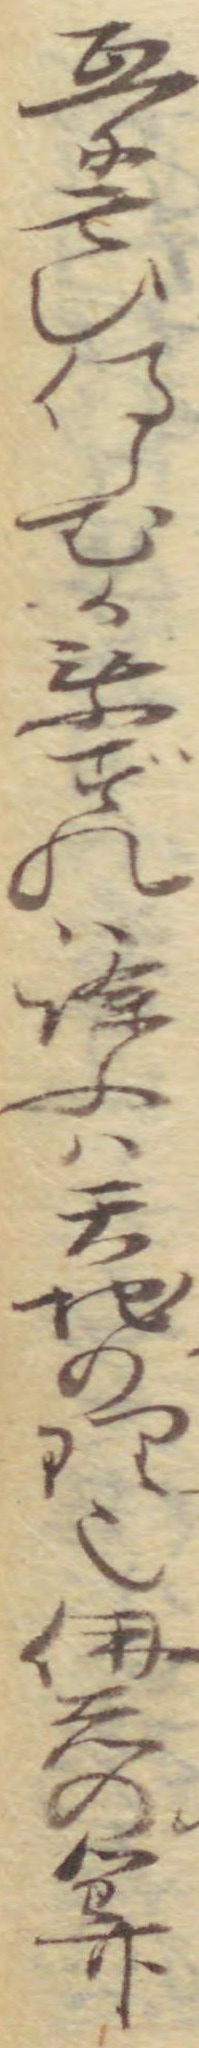互に亡ひ侍らむか乗ずれは除ふは天地の理也仏者の算
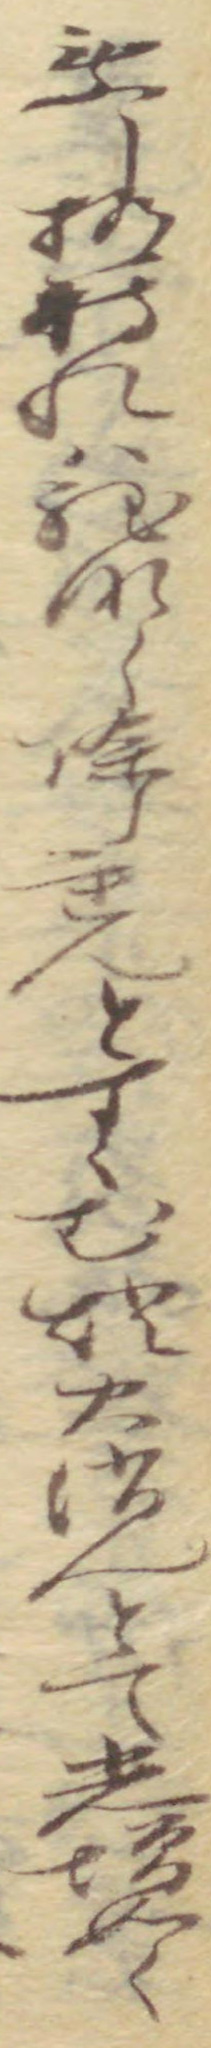乗し極侍れは程なく除られんとすゝむ燈火消んとて光増如く
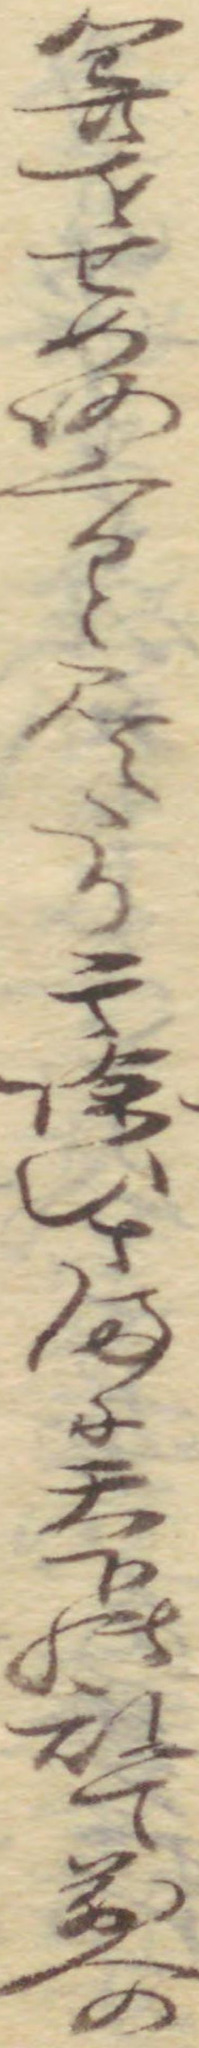算をせめあくると見えたり其除ひさまに天下の乱て万人の
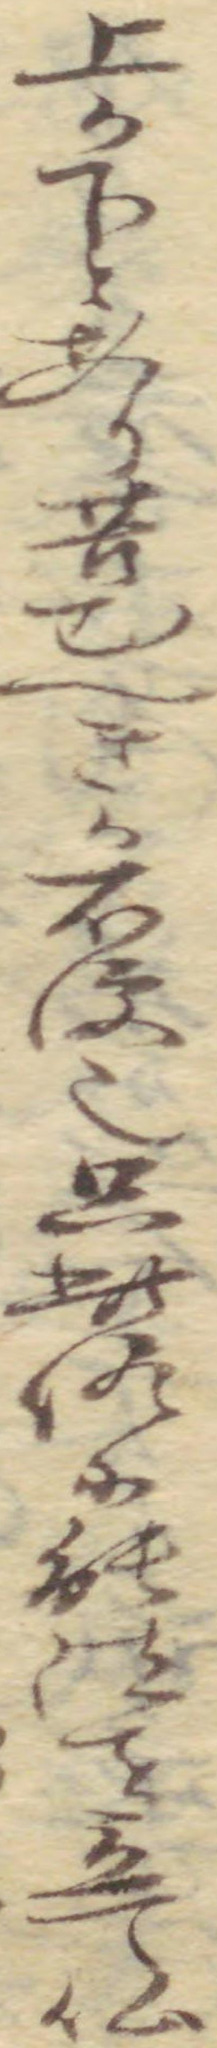上か下となり苦むへきか不便也只此侭に能法を立て仏
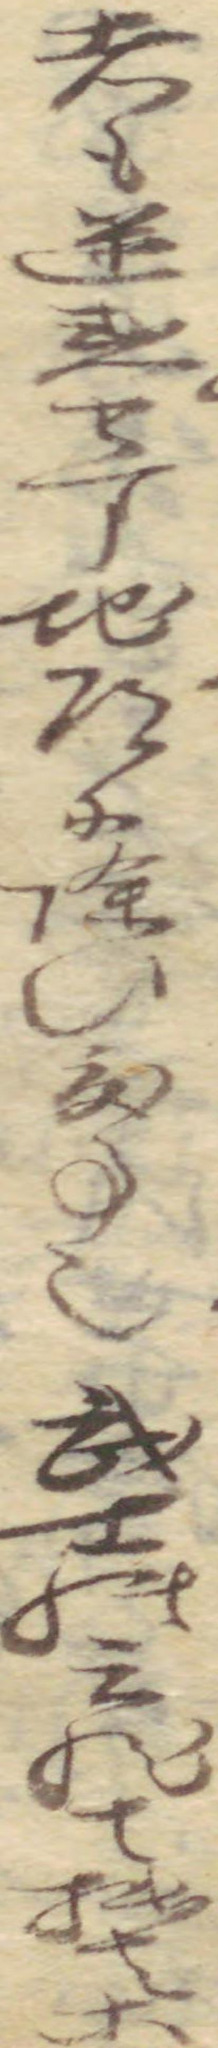者も迷惑せす地道に除ひ度事也武士の云然は拙者等
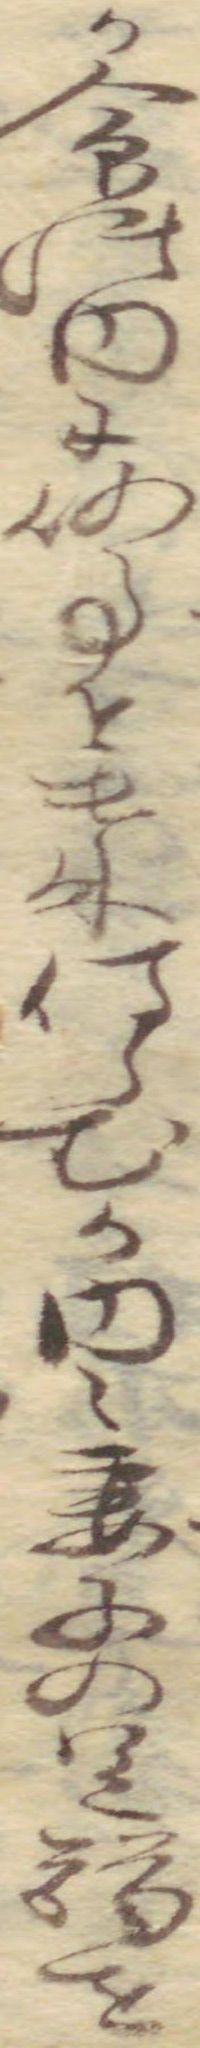か命の内に何事そ出来侍らむか内〻妻子の足弱を
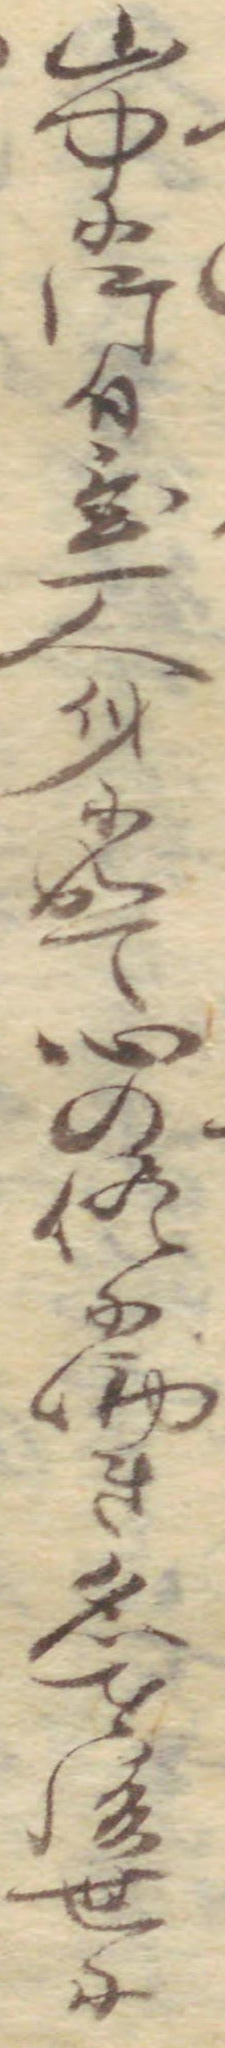山中に片付置一人身に成て心の侭に働き名を後世に
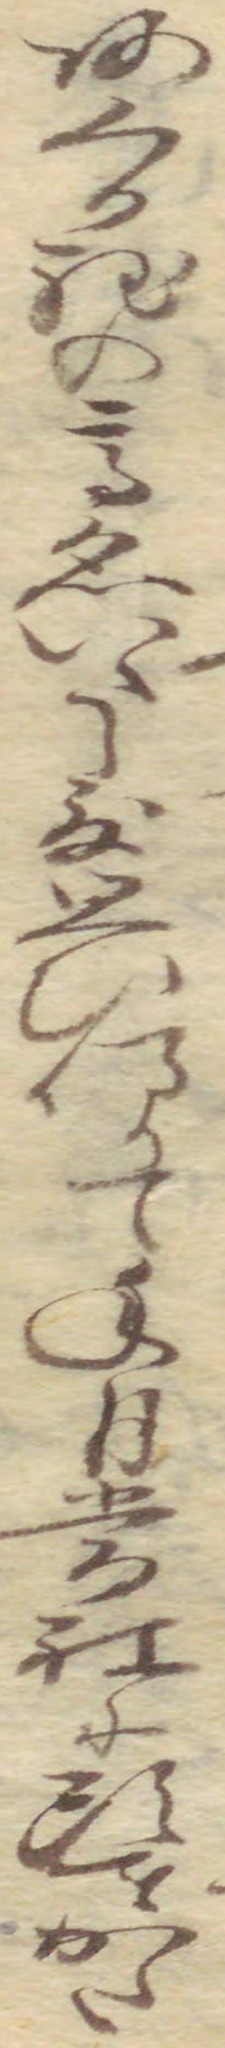あくる程の高名いたし度思ひ侍りて年月当社に頭をかた
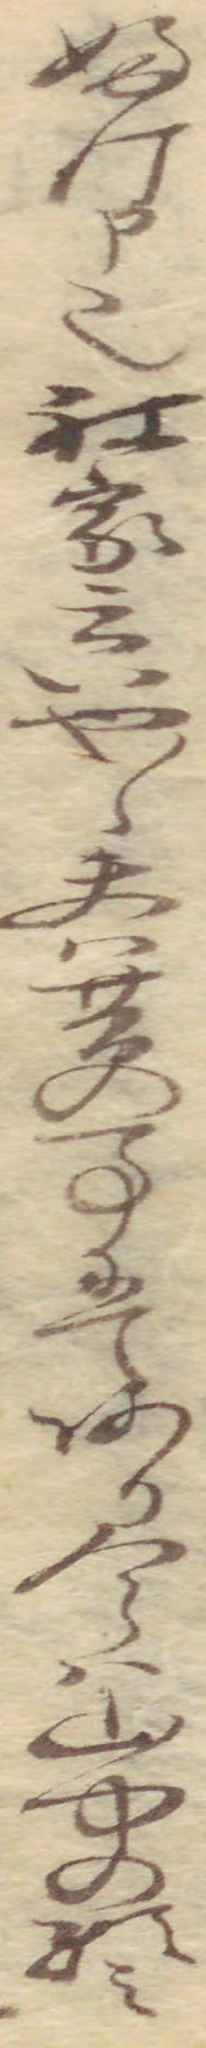ふけ申也社家云いや〳〵夫は昔の事にてあり今は山中の頼み
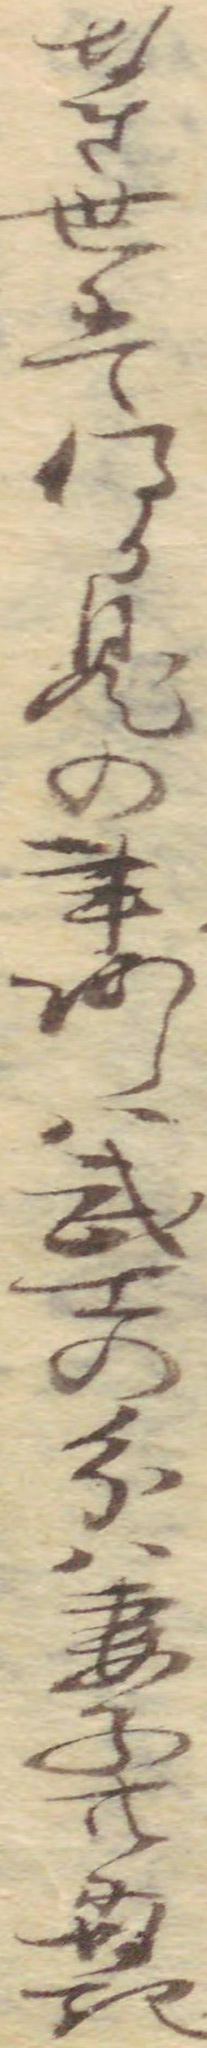なき世にて侍る自然の事あらは武士の分は妻子共になき
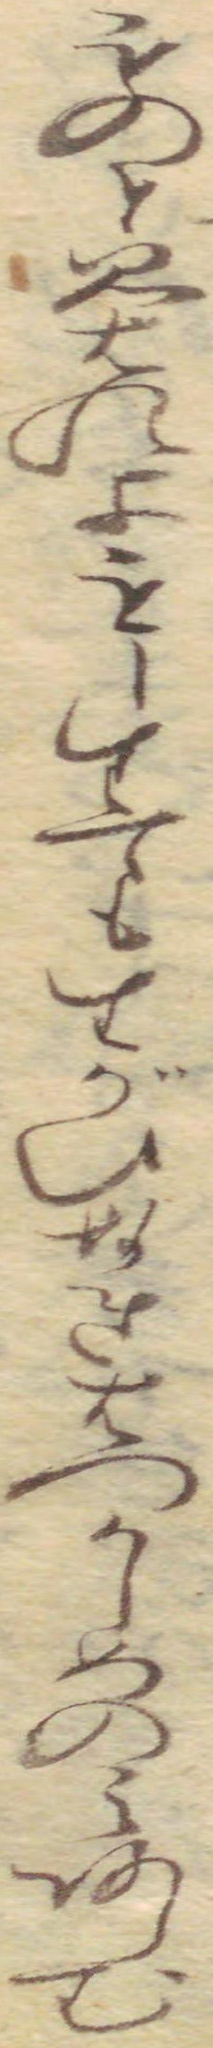ものと思はれよもし生ても生がひなきはつかしめのみあらむ
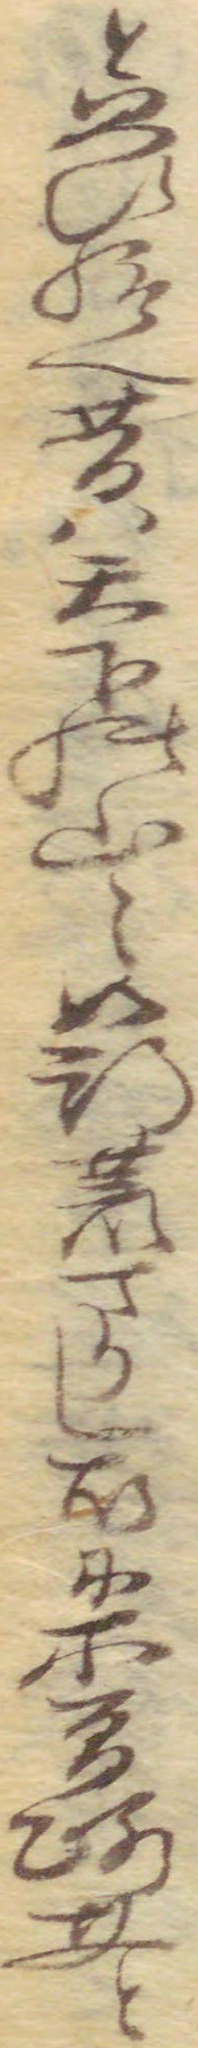と思ひ給へ昔は天下の山〻如斯荒さりし故に木曽路なと

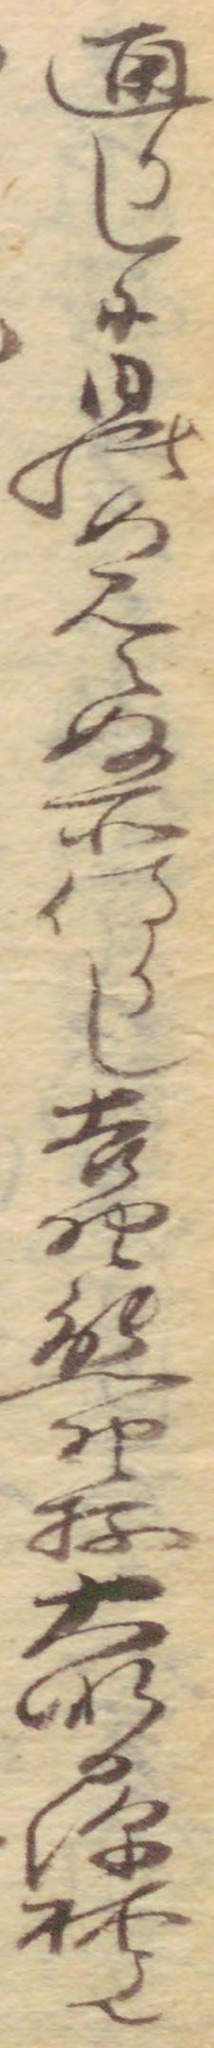通りしに日のめ見えぬ所侍りし吉野熊野抔大なる深林にて
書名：鶯宿雑記. 巻263-264
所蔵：国立国会図書館 National Diet Library, JAPAN
